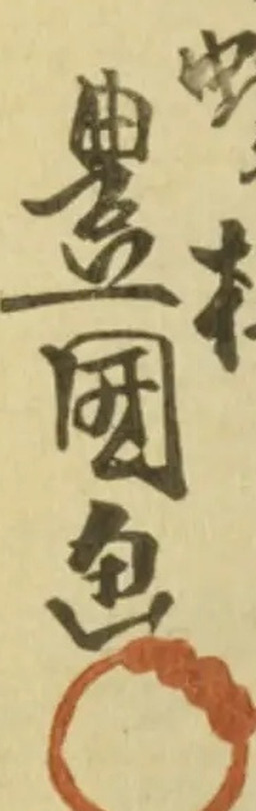豊国画
